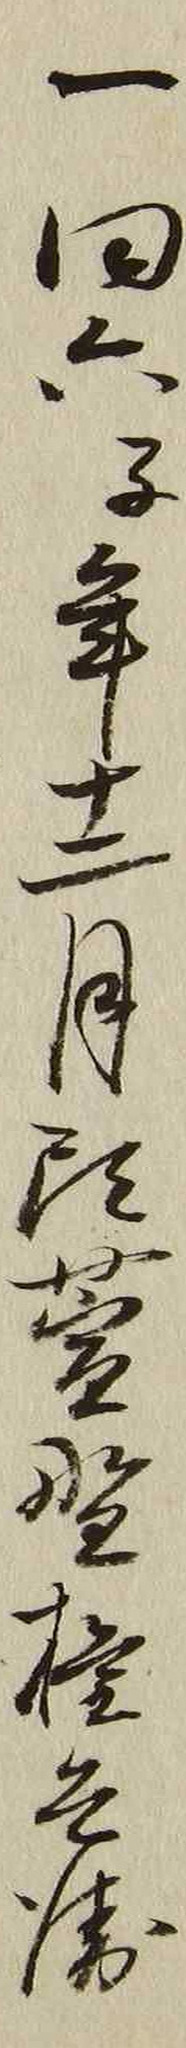一同六子年十二月頭萱野権兵衛
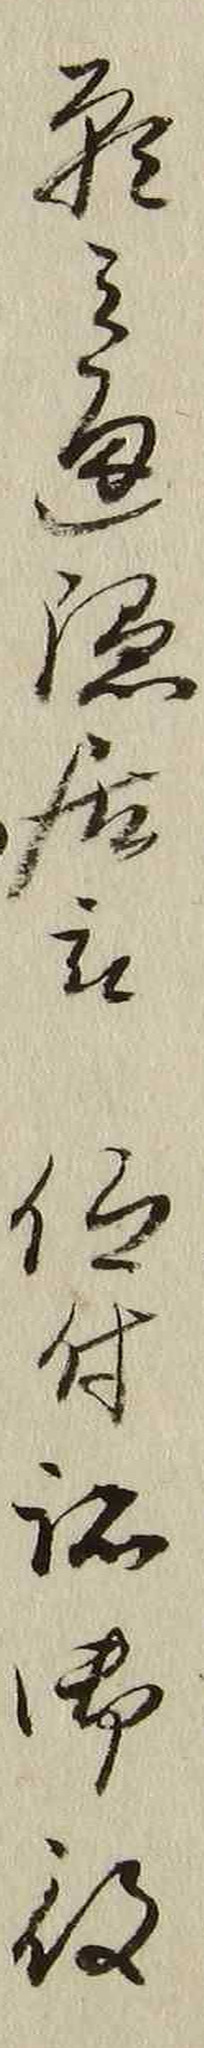願之通隠居被仰付跡御役
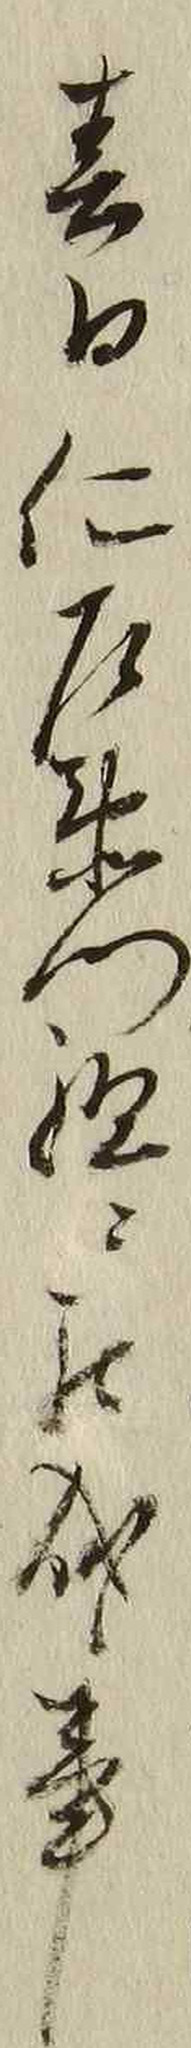春日仁左衛門組ニ罷成候事
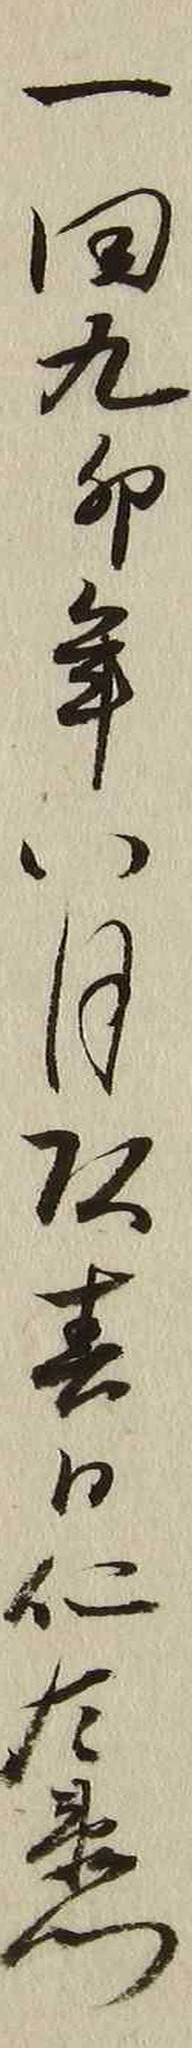一同九卯年八月頭春日仁左衛門
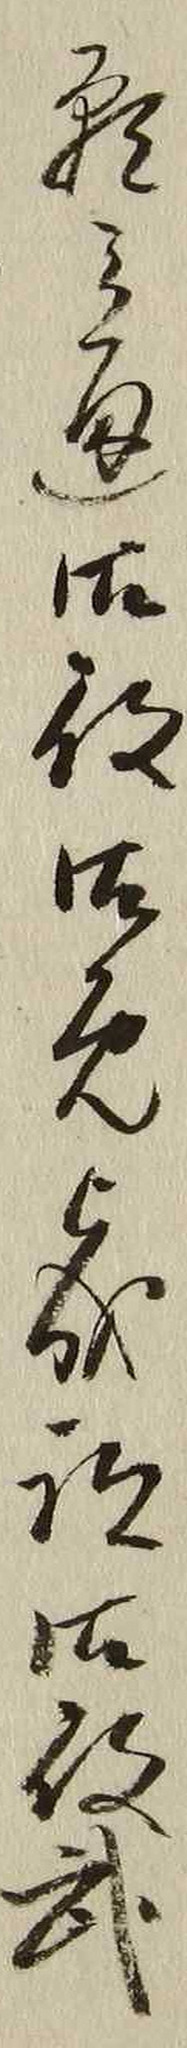願之通御役御免被成跡御役武
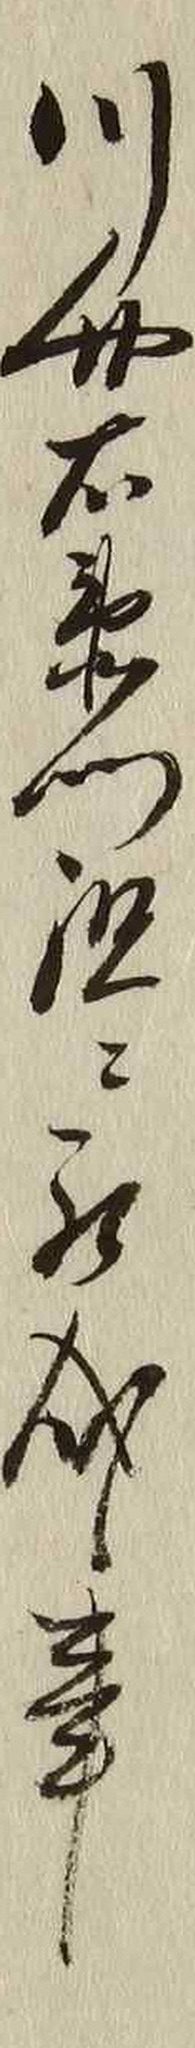川介右衛門組ニ罷成候事
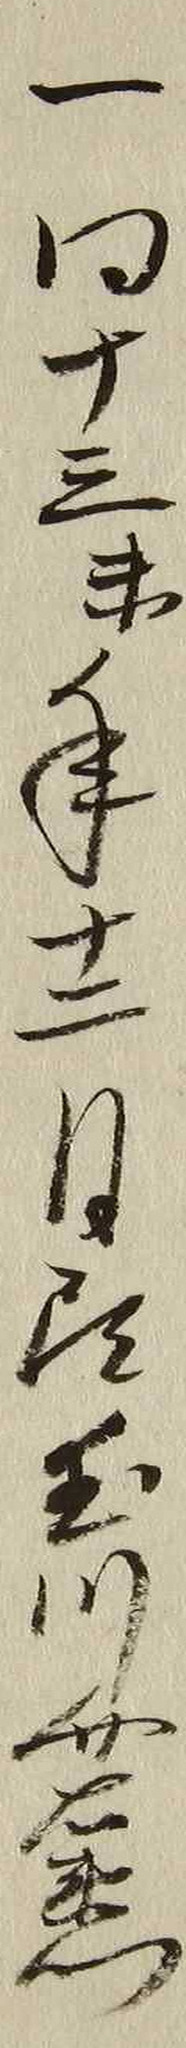一同十三未年十二月頭武川介右衛門
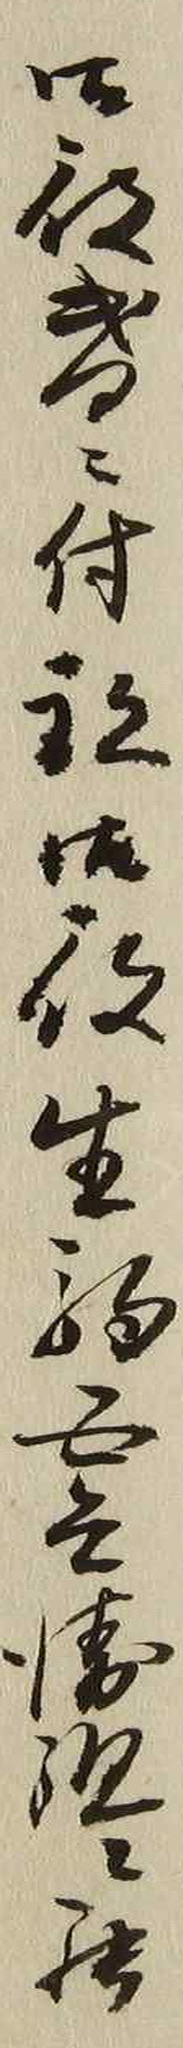御役替ニ付跡御役生駒五兵衛組ニ罷
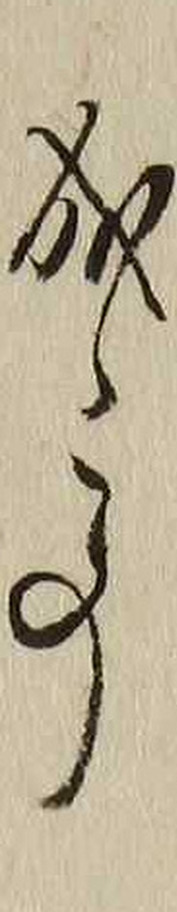成候事
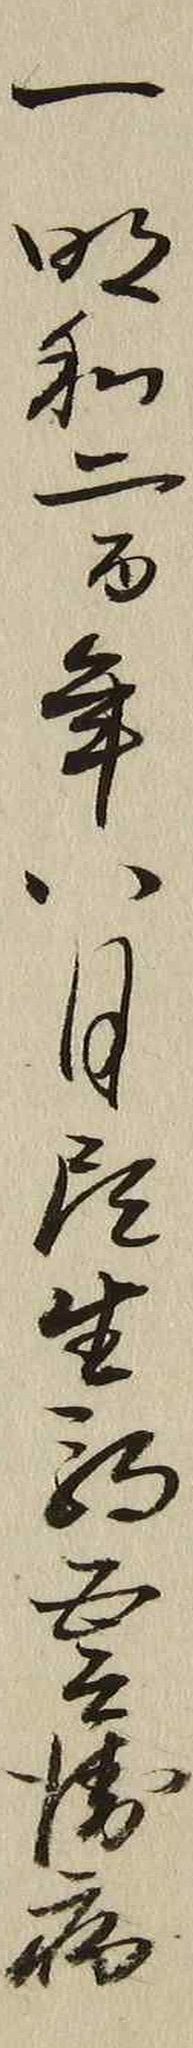一明和二酉年八月頭生駒五兵衛病
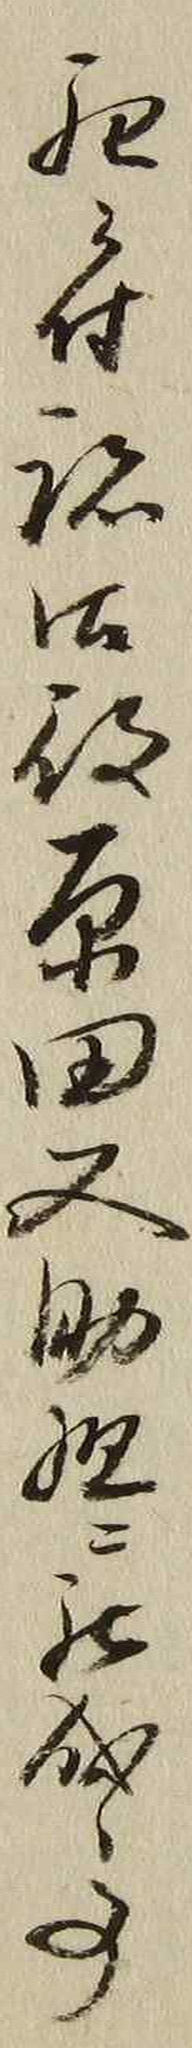死ニ付跡御役原田又助組ニ罷成候事
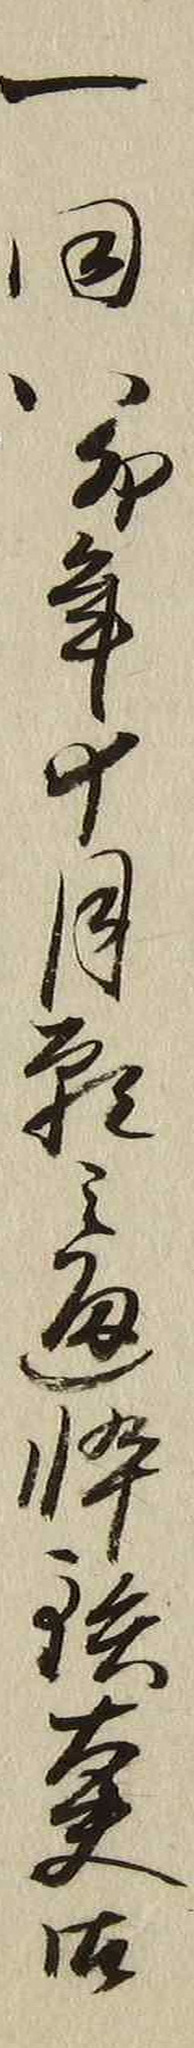一同八卯年十月願之通忰鉄太夫御
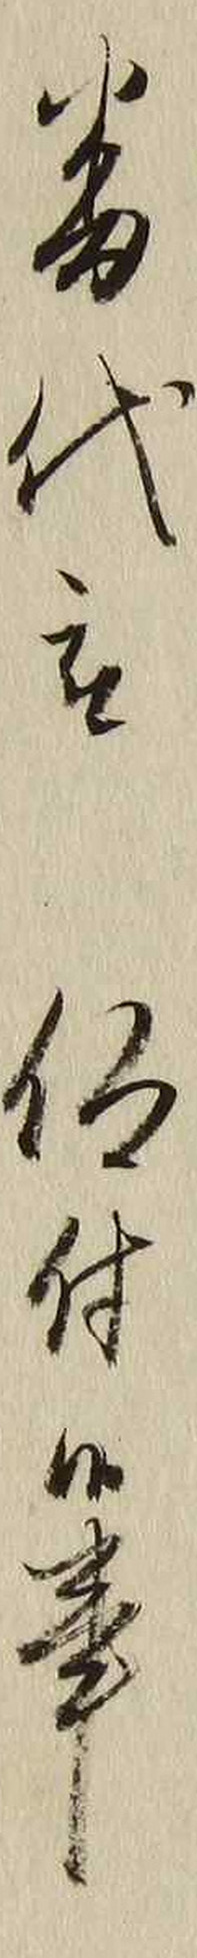番代被仰付候事
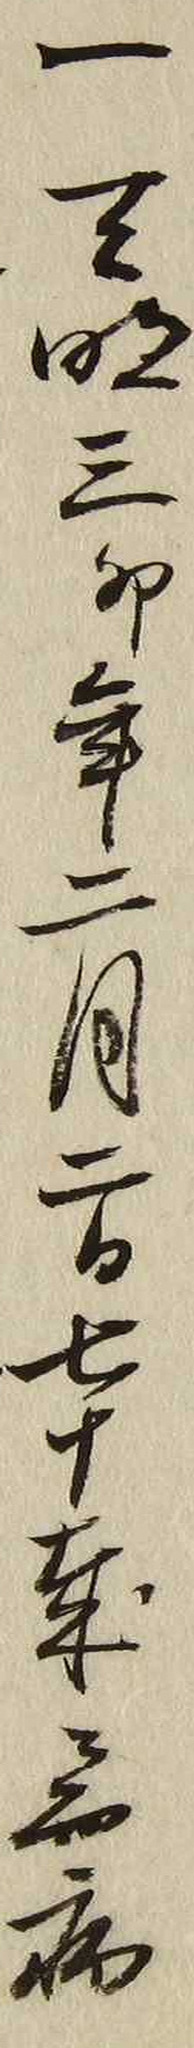一天明三卯年二月二日七十歳ニ而病
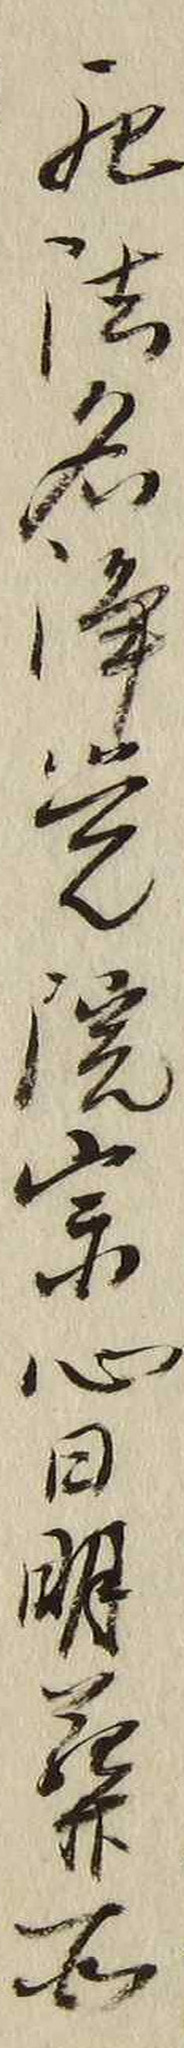死法名浄覚院宗心日明葬所
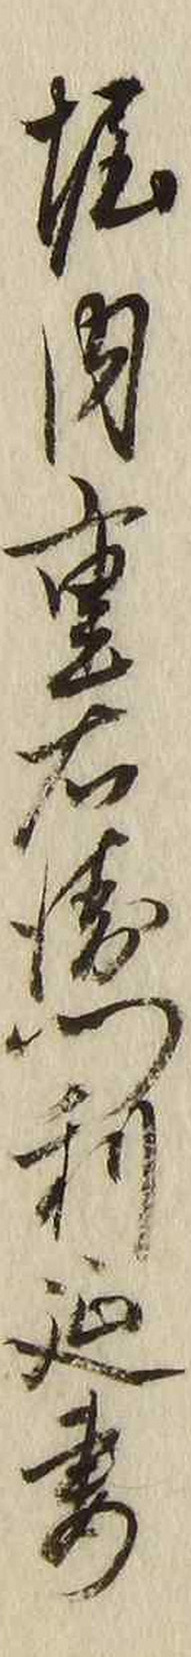女堀内重右衛門利延妻
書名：諸士系譜　巻之352　す之部2
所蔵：会津若松市立会津図書館
